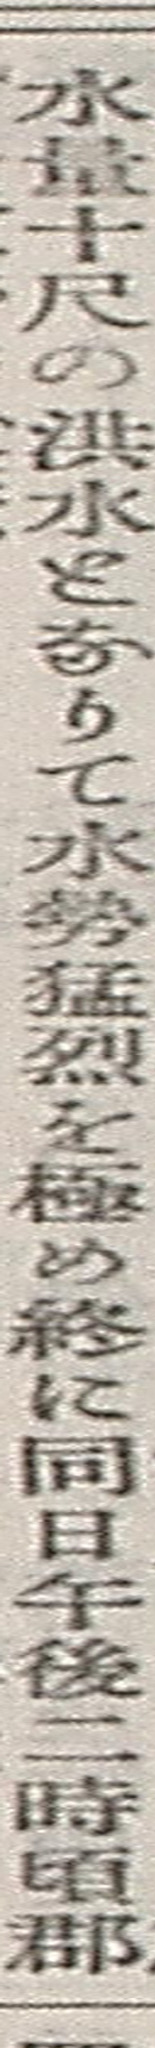水量十尺の洪水となりて水勢猛烈を極め終に同日午後二時頃郡
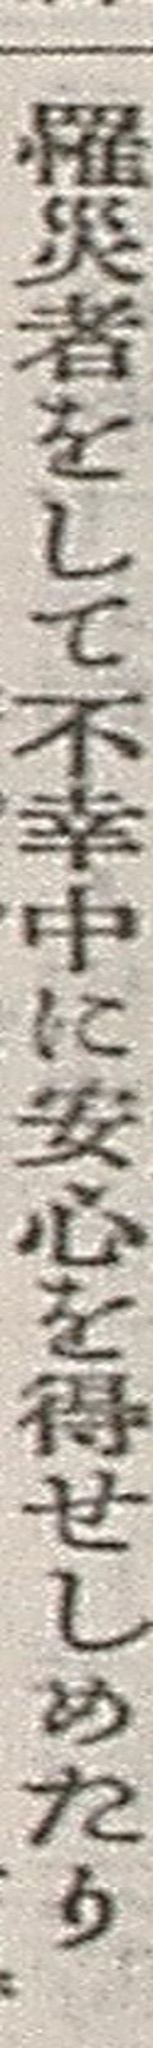罹災者をして不幸中に安心を得せしめたり
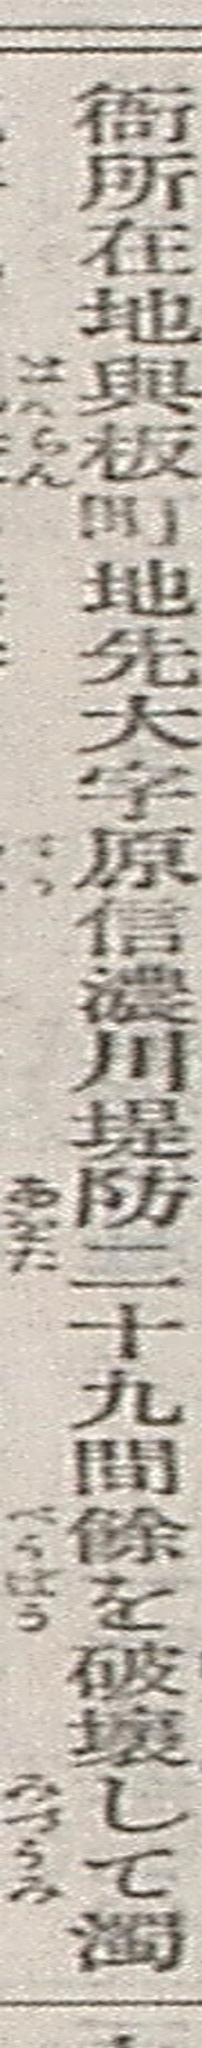衙所在地与板町地先大字原信濃川堤防二十九間餘を破壊して濁
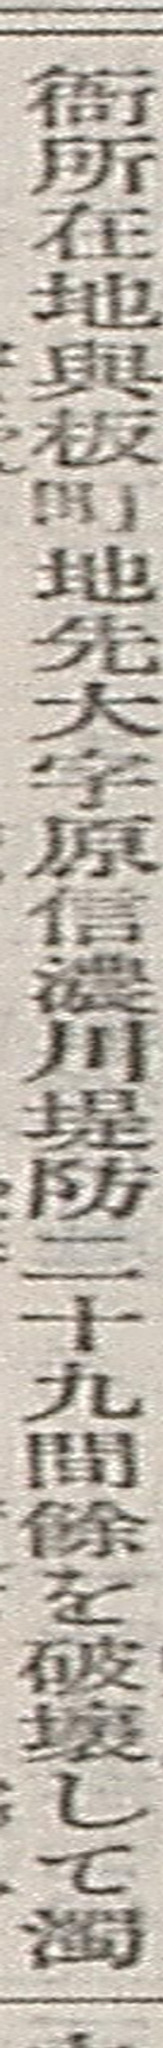衙所在地与板町地先大字原信濃川堤防二十九間餘を破壊して濁
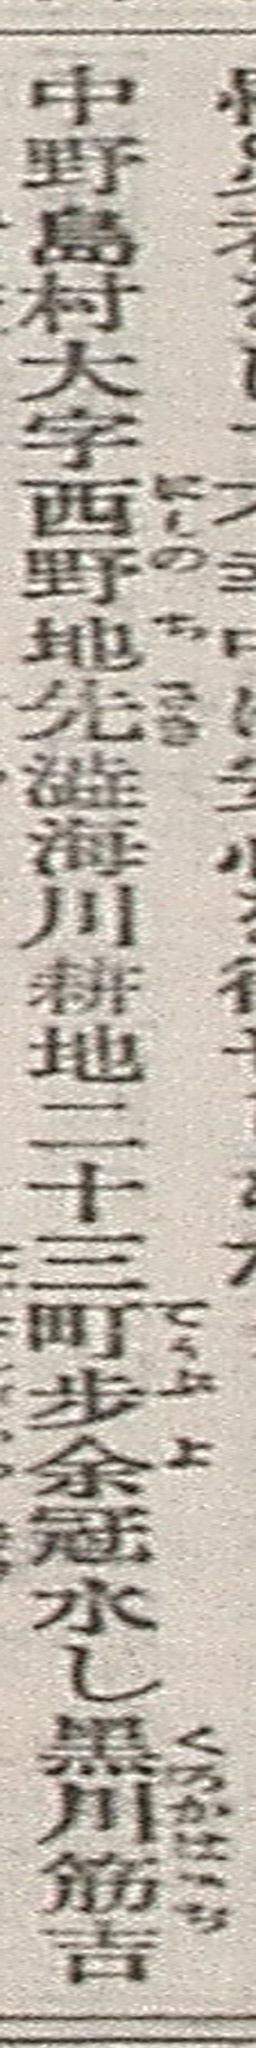中野島村大字西野地先渋海川耕地二十三町歩余冠水し黒川筋吉
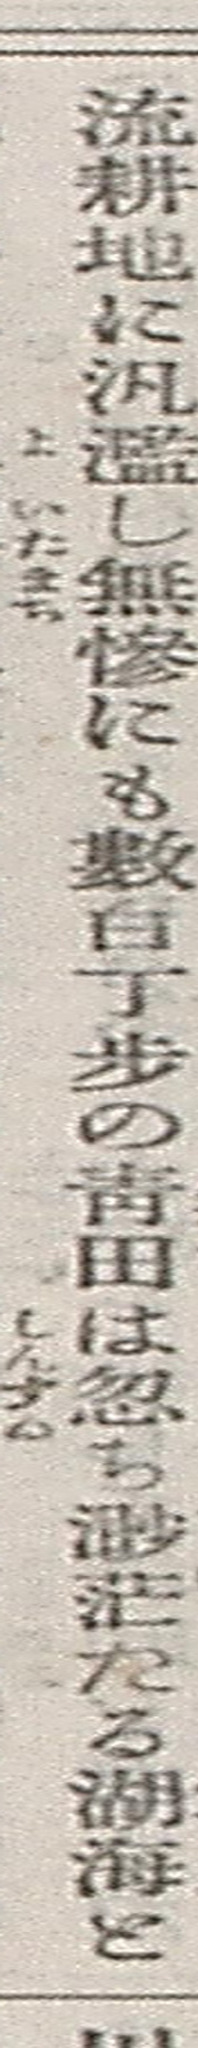流耕地に氾濫し無惨にも数百丁歩の青田は忽ち渺茫たる湖海と
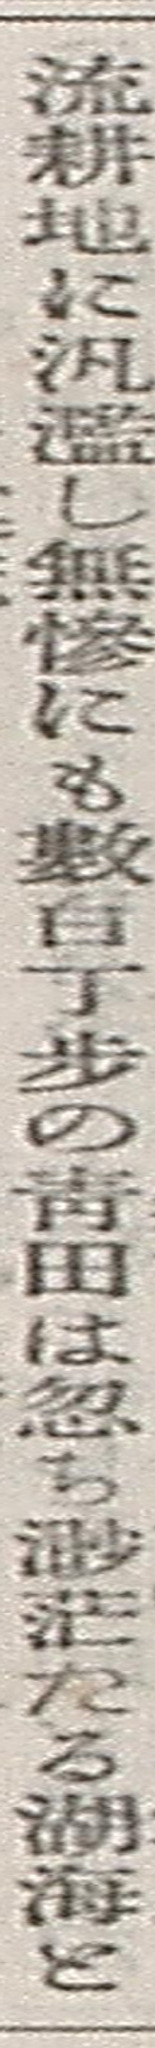流耕地に氾濫し無惨にも数百丁歩の青田は忽ち渺茫たる湖海と
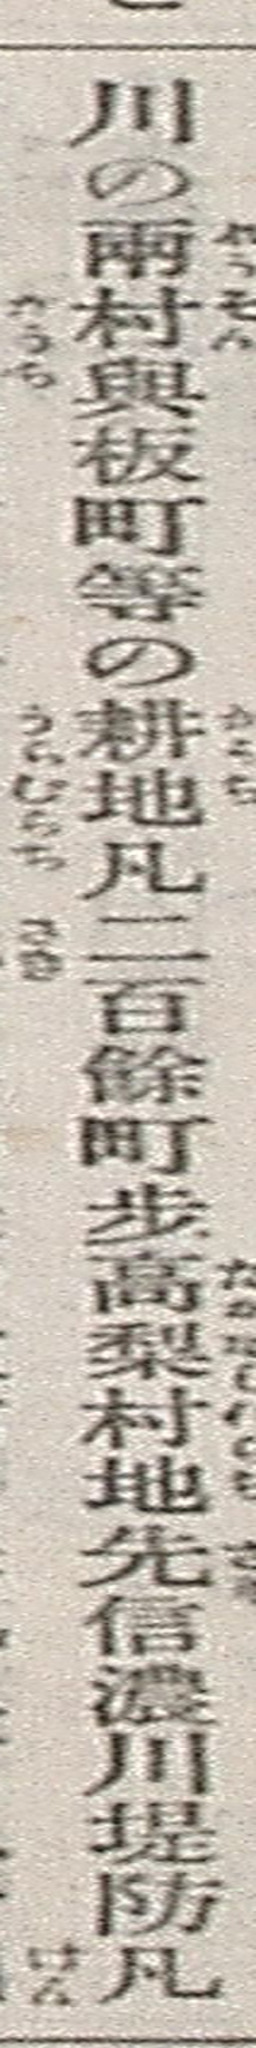川の両村与板町等の耕地凡二百餘町歩高梨村地先信濃川堤防凡
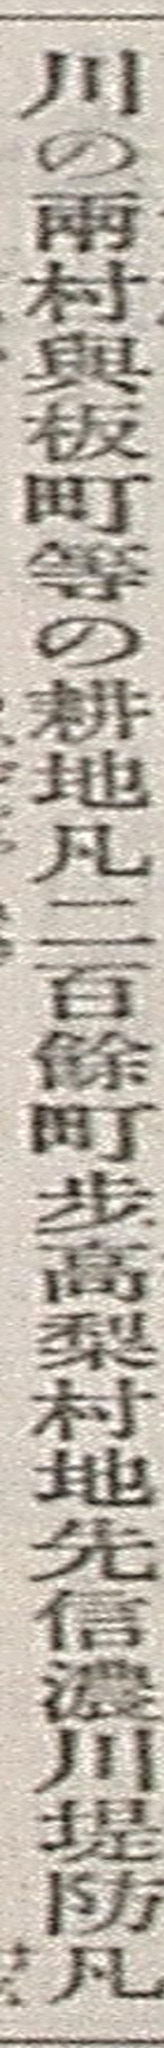川の両村与板町等の耕地凡二百餘町歩高梨村地先信濃川堤防凡
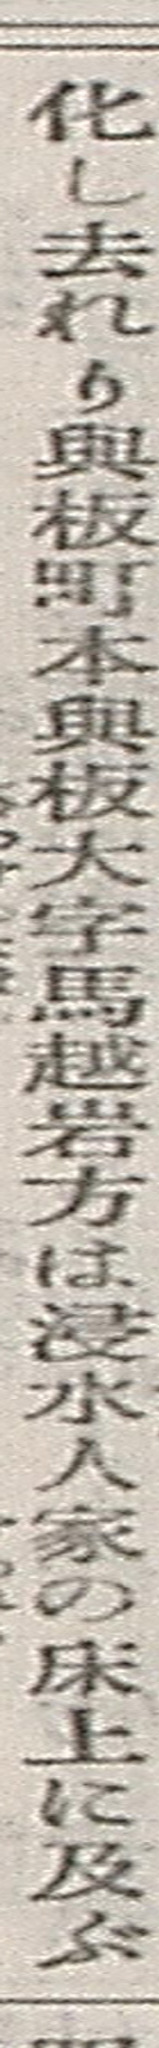化し去れり与板町本与板大字馬越岩方は浸水人家の床上に及ぶ
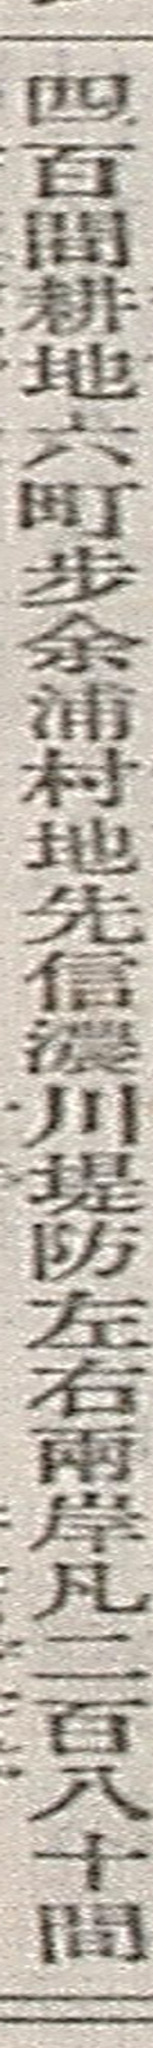四百間耕地六町歩余浦村地先信濃川堤防左右両岸凡二百八十間
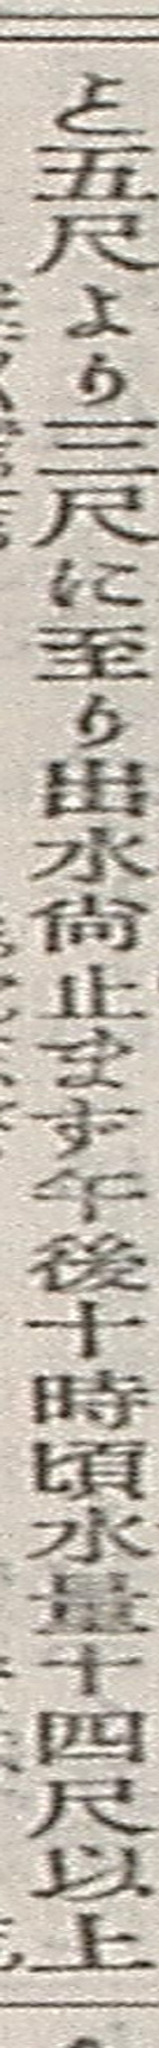こと五尺より三尺に至り出水尚止まず午後十時頃水量十四尺以上
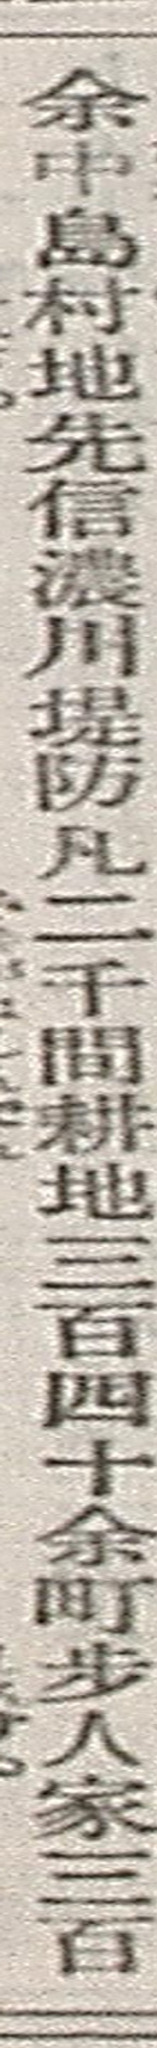余中島村地先信濃川堤防凡二千間耕地三百四十余町歩人家三百
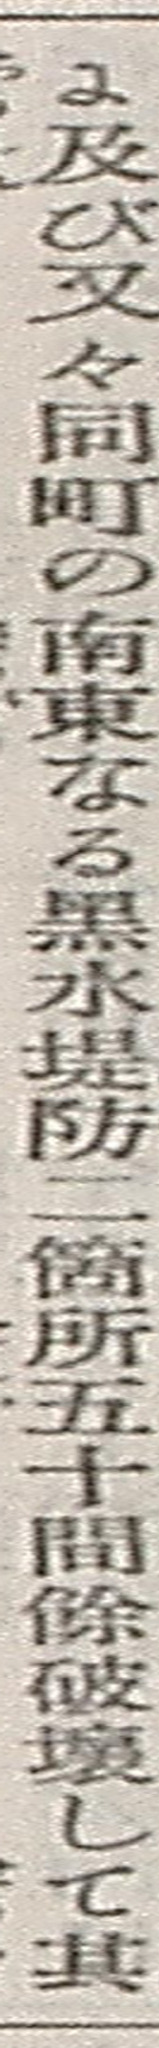に及び又々同町の南東なる黒水堤防二箇所五十間餘破壊して其
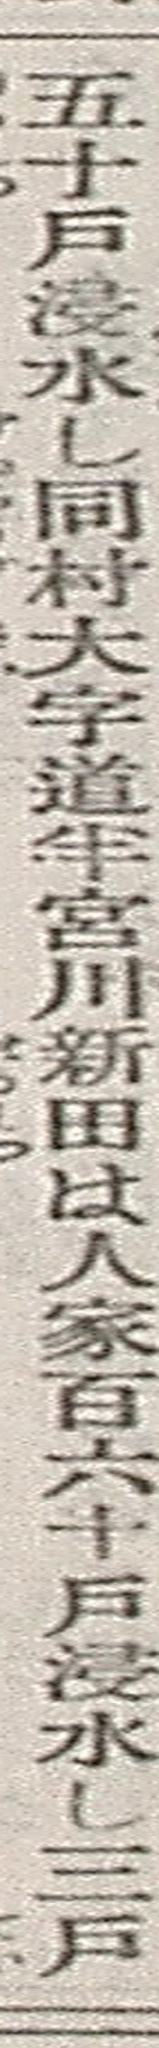五十戸浸水し同村大字道半宮川新田は人家百六十戸浸水し三戸
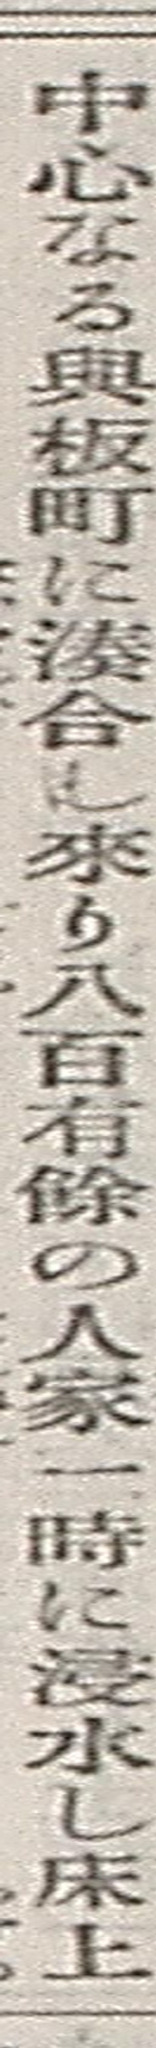中心なる与板町に湊合し来り八百有餘の人家一時に浸水し床上
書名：風俗畫報臨時増刊第百二十八號　洪水被害録（下）
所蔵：東京大学地震研究所図書室 Earthquake Research Institute Library, The University of Tokyo, JAPAN
